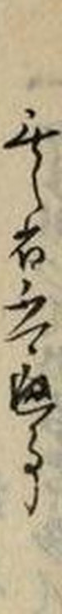無之者不可通候事
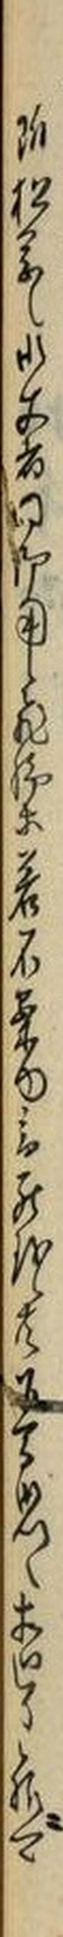附松岡之御使者同御用之飛脚等若不案内に而罷越候共下馬御門へ相廻り候様に可
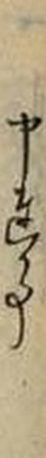申達候事
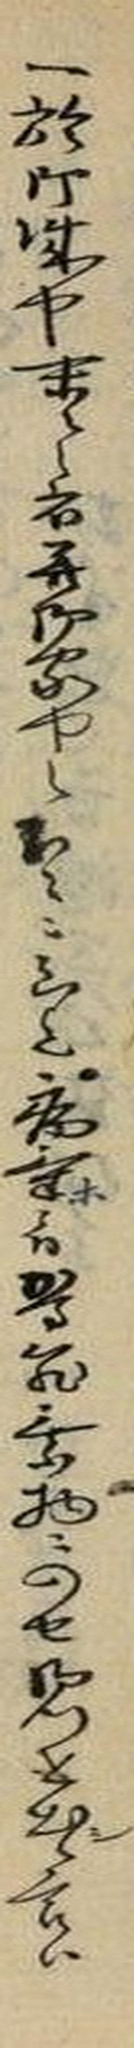一於御城中末々之者并御家中之下々に至迄病気に付駕籠乗物にのせ御門を出シ候節は
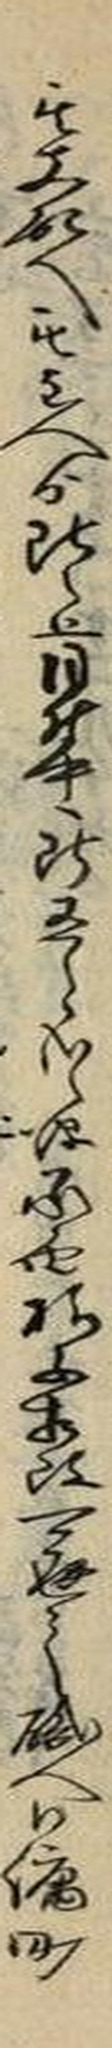其支配人其主人ゟ断之上目付中へ断有之候哉之儀承届様子相改可通之職人日傭町
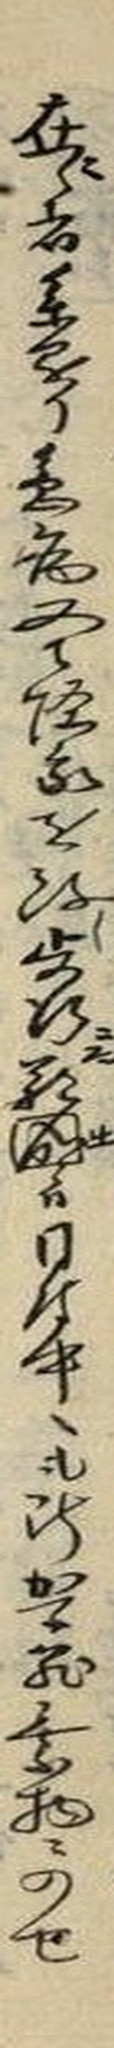在々之者参懸り急病又は怪我を致し歩行に而難出候に付目付中へも断駕籠乗物にのせ
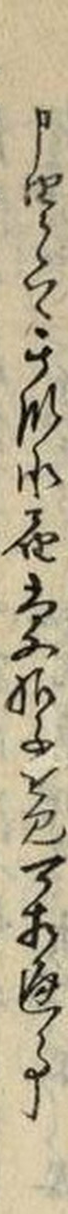申由ニ候はゝ其段承届尚又様子を見可相通事
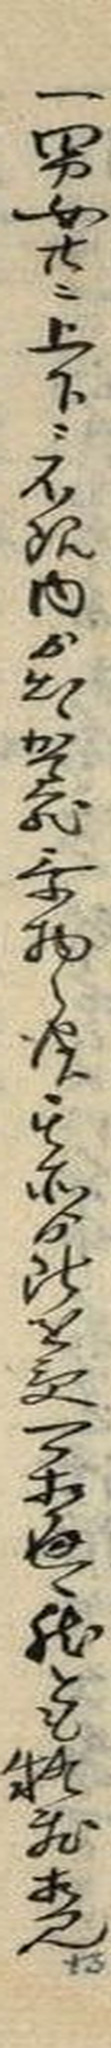一男女共ニ上下ニ不限内ゟ出候駕籠乗物之儀ハ其所ゟ断を受可相通候然とも疑敷相見
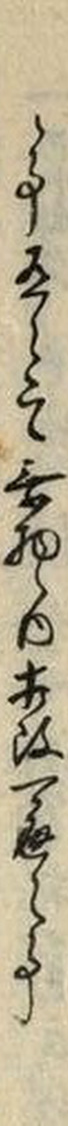候事有之候ハヽ乗物之内相改可通候事
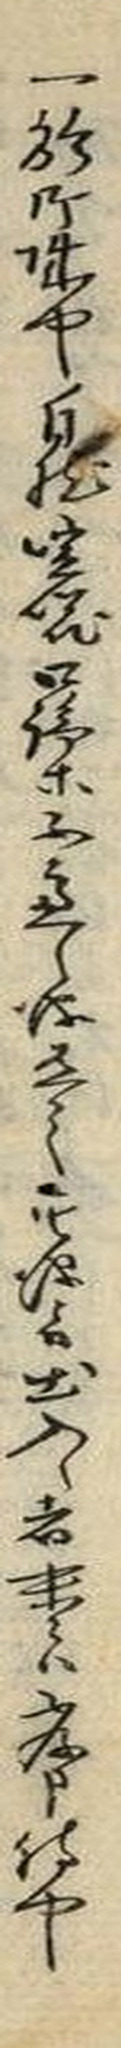一於御城中自然喧嘩口論等不慮之儀有之其儀に付出入候者末々は不及申侍中
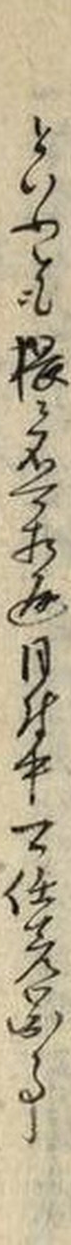といふとも猥に不可相通目付中可任差図候事
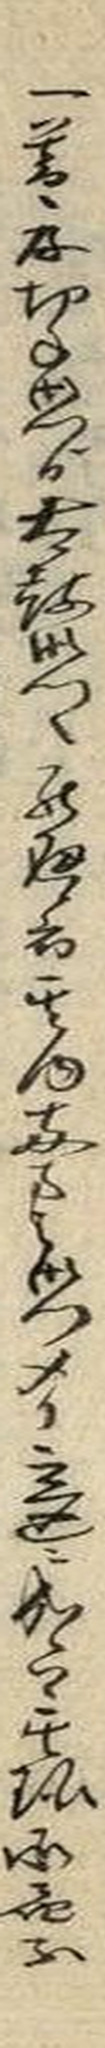一暮へ及切手御門ゟ太鼓御門へ罷通候者其内両方之御門〆り立込に成候はゝ其趣承届不
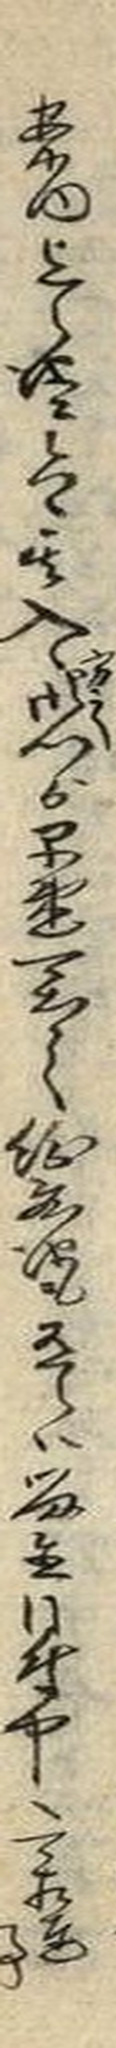案内迄之儀に候はゝ其入候方之御門ゟ早速可出之紛敷儀も有之は留置目付中へ可相達事
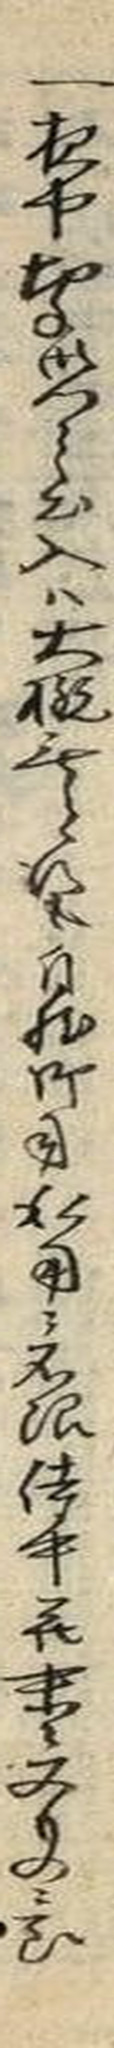一夜中切手御門之出入は大概無之候得共自然御用私用に不限侍中并末々之又ものに至
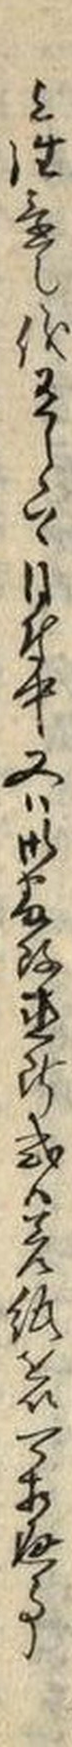迄往還之儀有之候はゝ目付中又は御番改直断或は差紙を以可相通候事
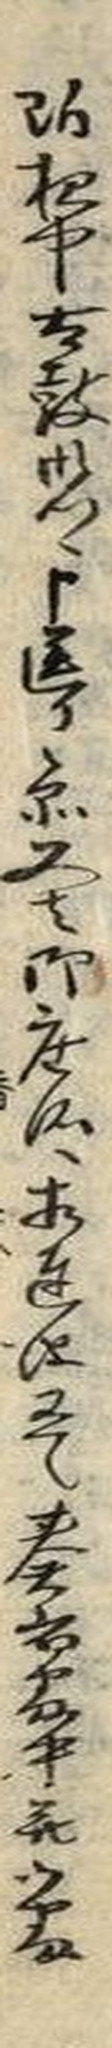附夜中太鼓御門へ申送り候品又は御座所へ相達儀有之奏者番中并御番
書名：御門御櫓之部
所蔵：福井県文書館 Fukui Prefectural Archives
